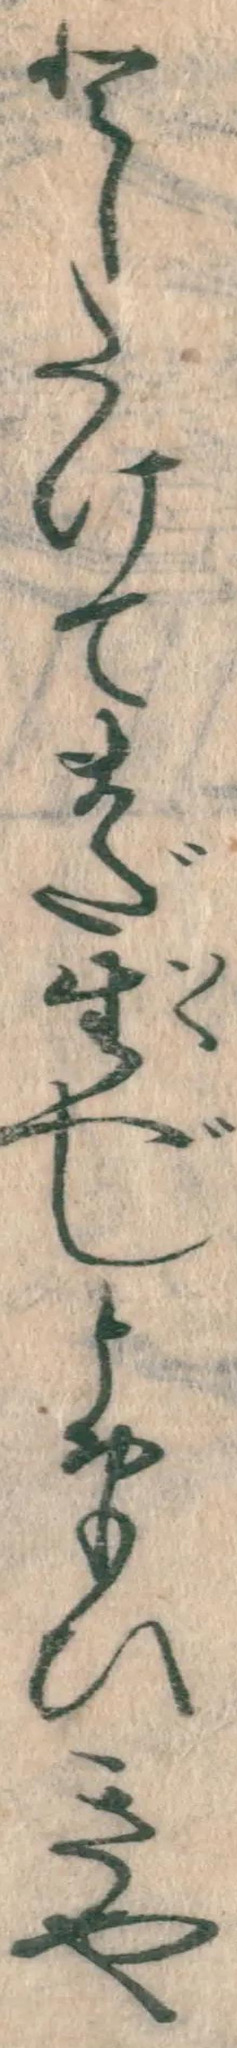としたけてまだ生べしとおもいきや
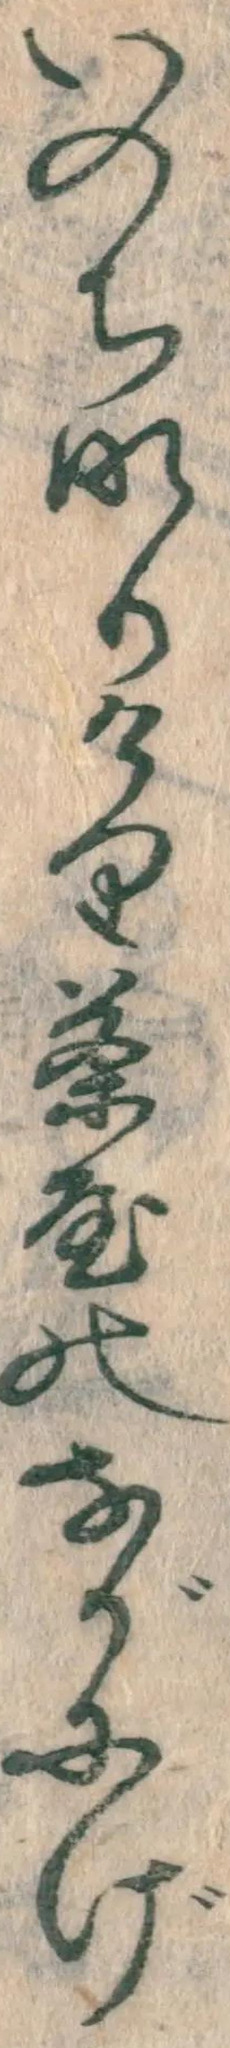いのちなりけり茶屋のながにげ

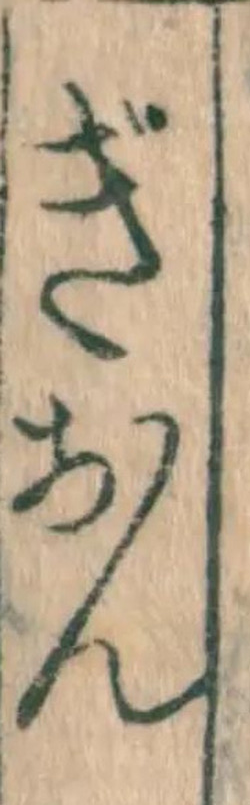ぎおん

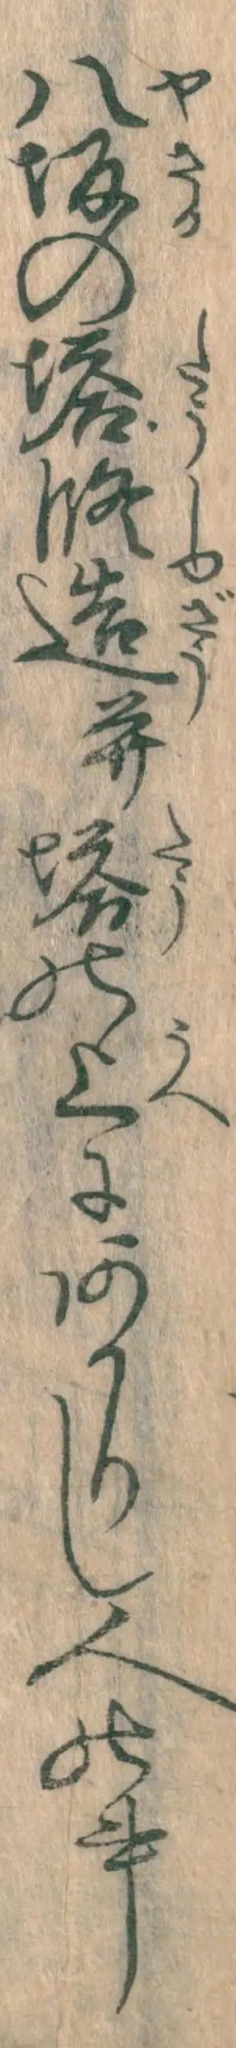八八坂の塔修造并塔の上にあかりし人の事
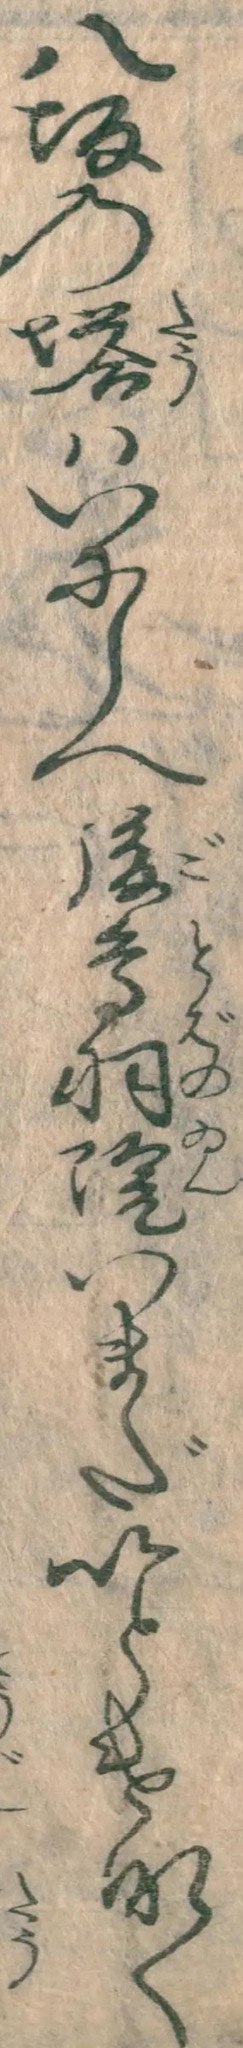八坂の塔はいにしへ後鳥羽院いまだいとけなく
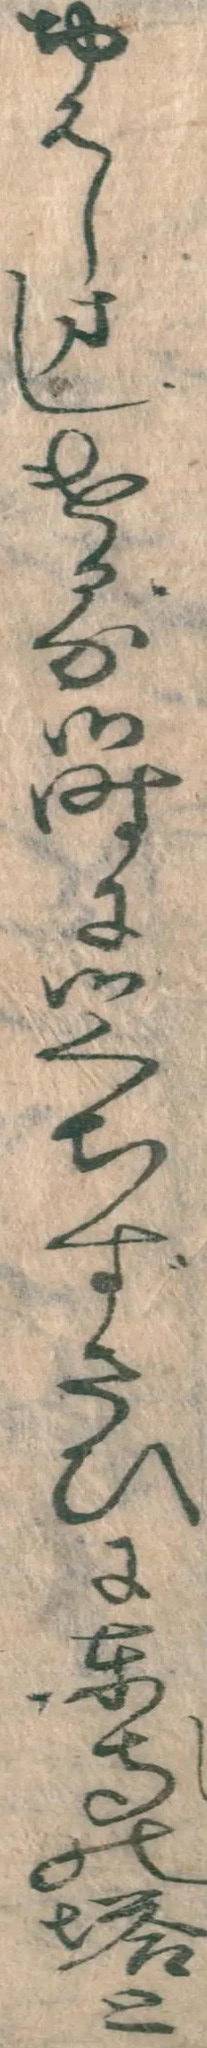おはしましけるが御時に御くちすさひに東寺の塔と
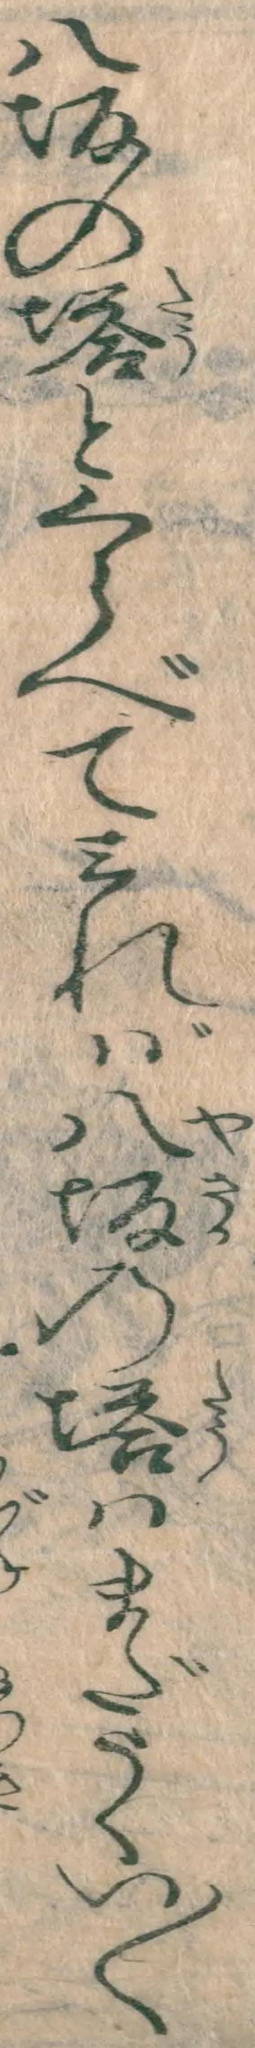八坂の塔とくらべてみれば八坂の塔はまだうゝい〳〵
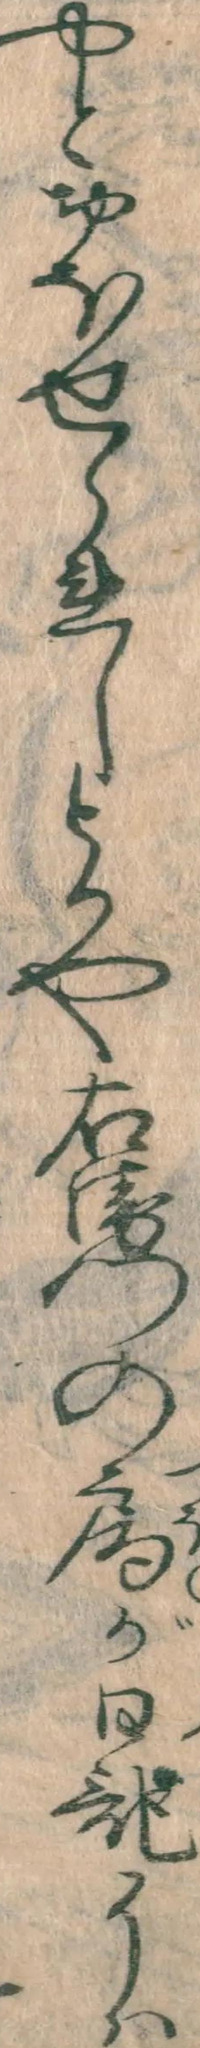やとおほせられしとかや右衛門の局が日記には
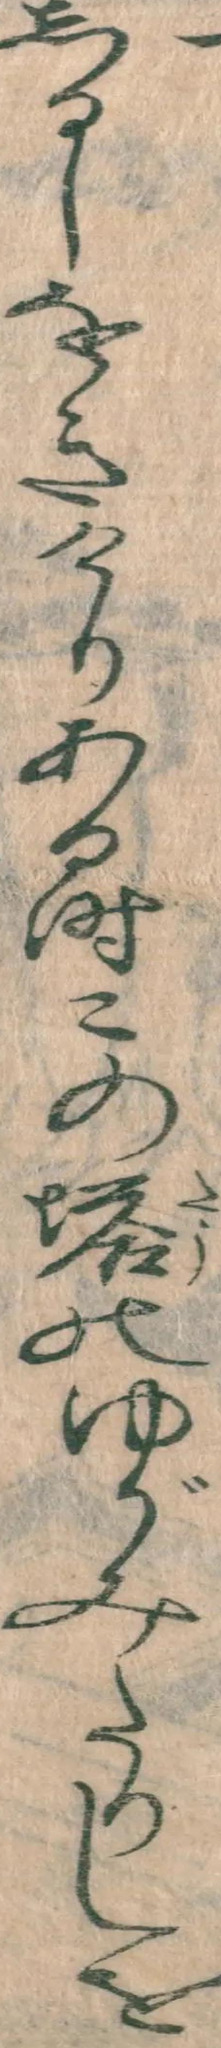しるしをきけりある時この塔のゆがみたりしを
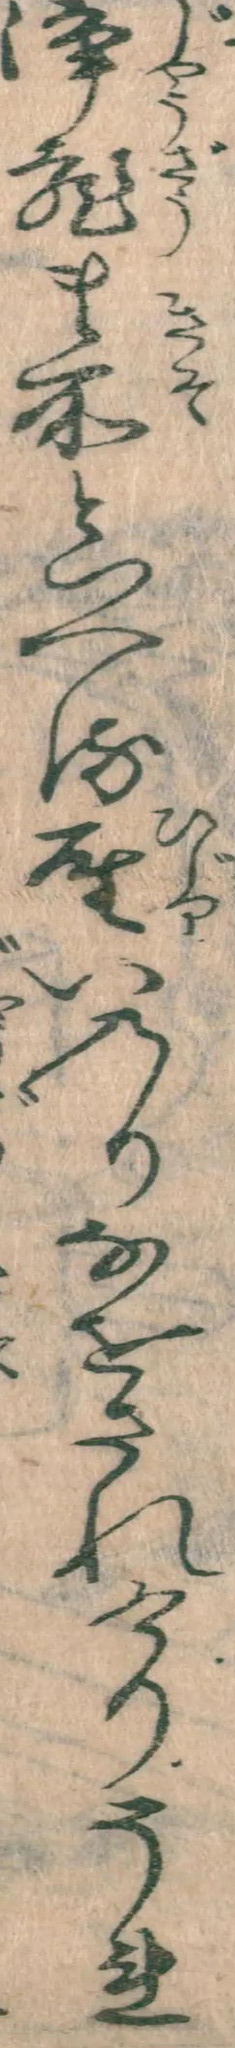浄蔵貴所といへる聖いのりなをされけりそれ
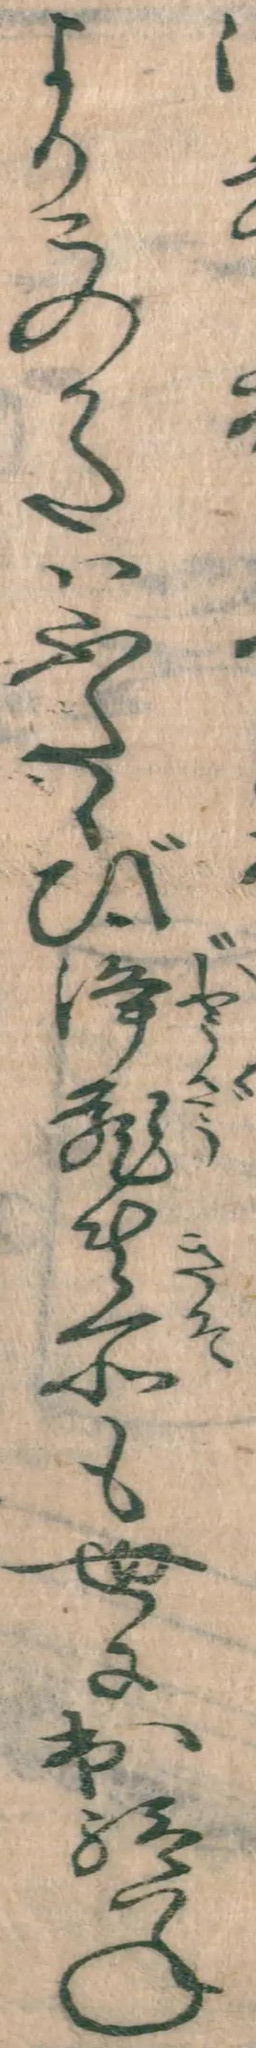よりこのかたはふたゝび浄蔵貴所も世に出給はね
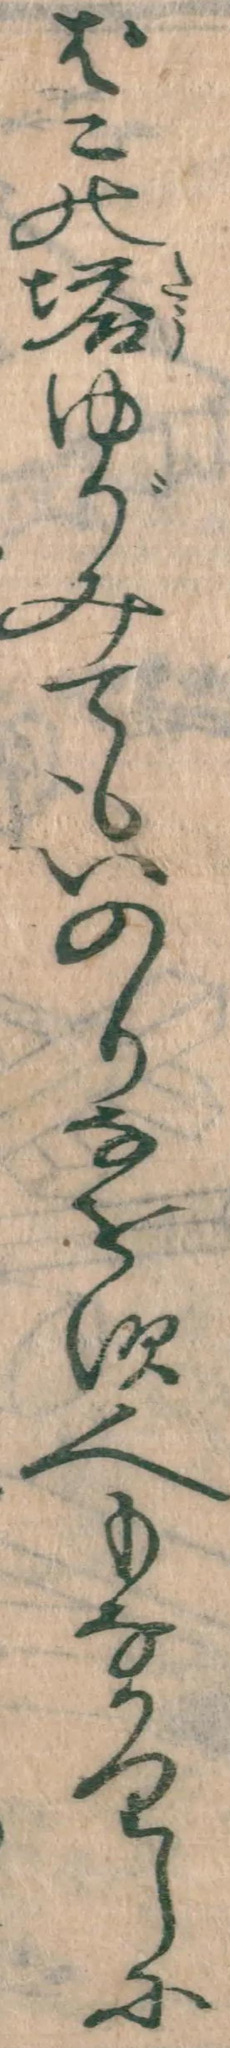はこの塔ゆがみてもいのりなをす人もなかりしに
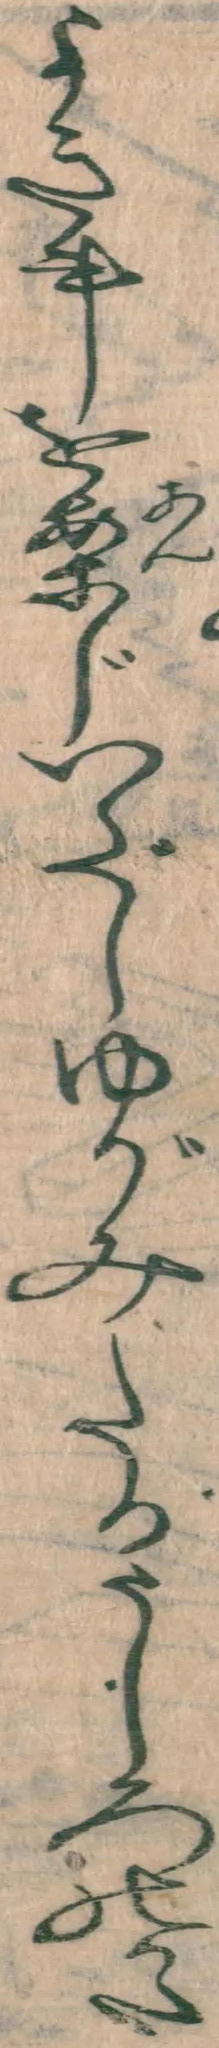よき事を案じいだしゆがみたるううしろのかた
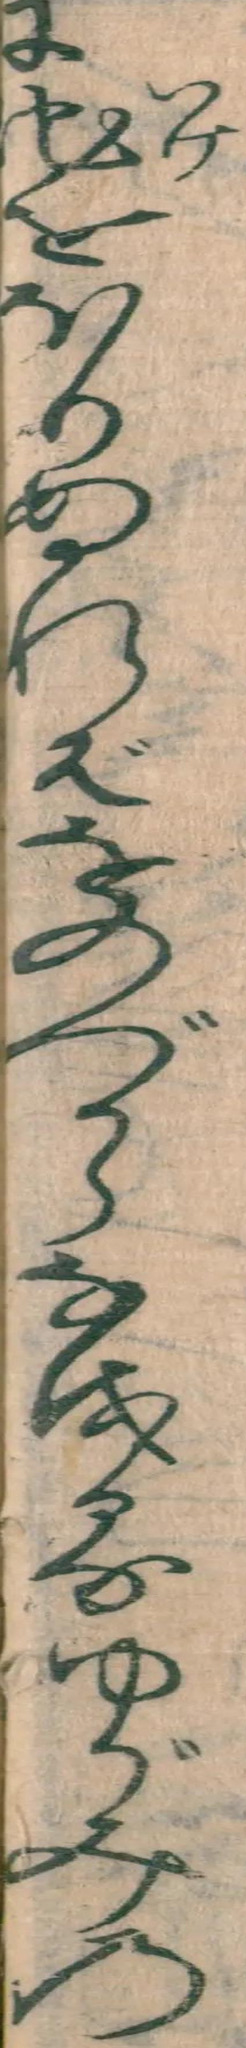に池をほりぬればをのづからなをるゆがみの
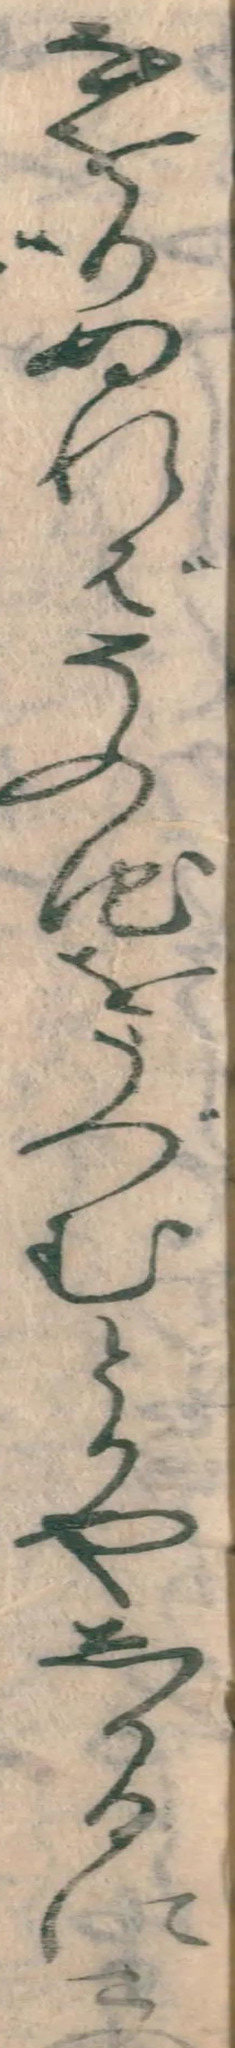なをりぬればその池をうづむとかやしかるにこの
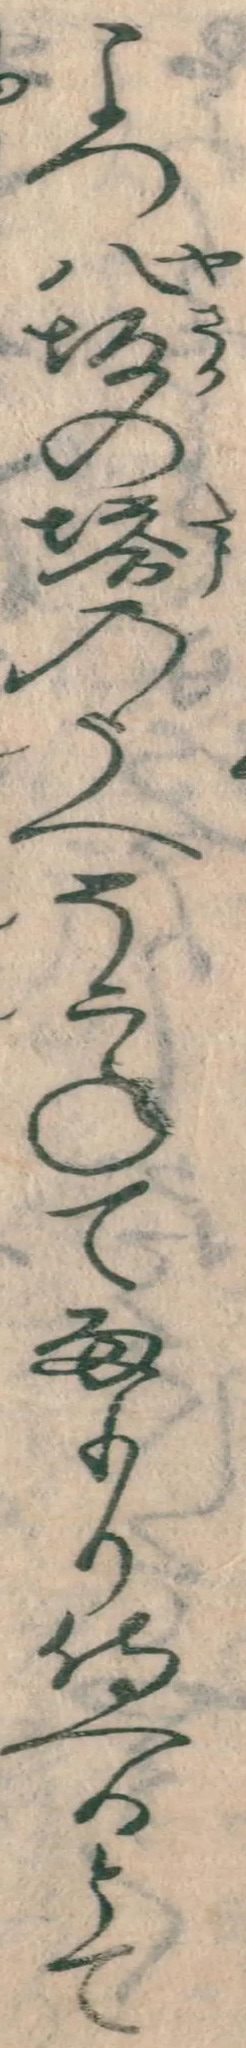ころ八坂の塔のうへそこねてまもり侍へるとて
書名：艱難目異志. 上,下
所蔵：国立国会図書館 National Diet Library, JAPAN
